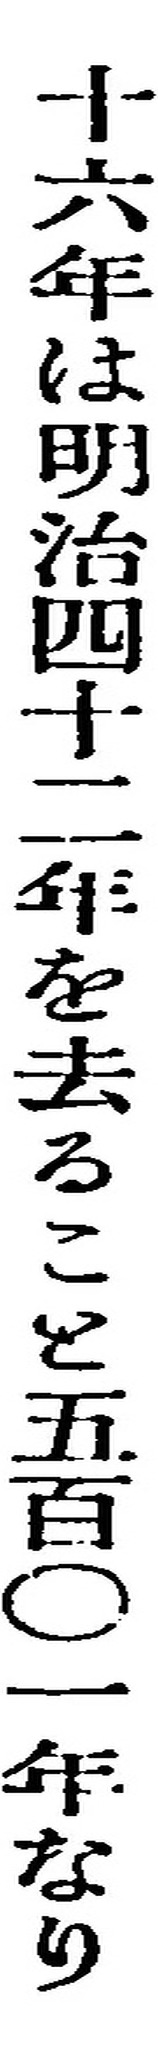十六年は明治四十二年を去ること五百〇一年なり
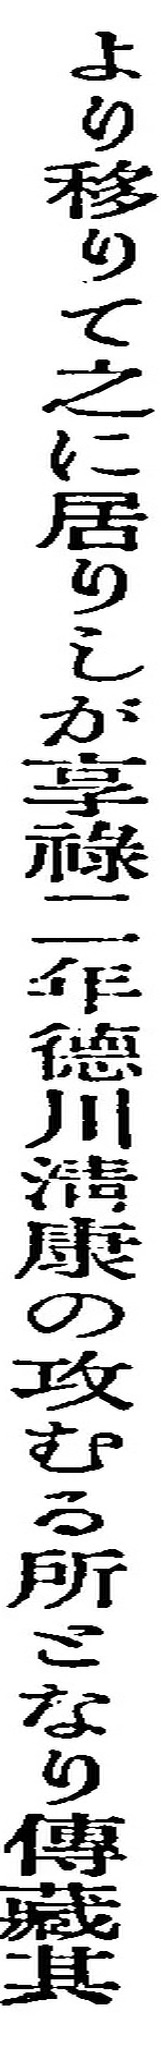より移りて之に居りしが享祿二年德川淸康の攻むる所となり傳藏其
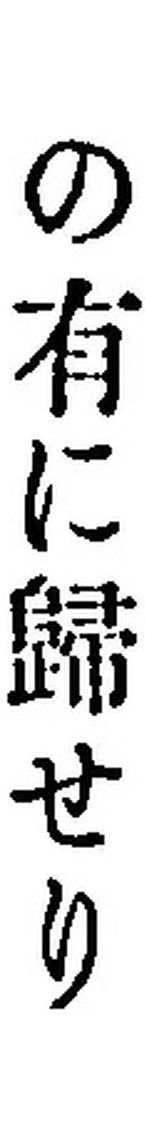の有に歸せり
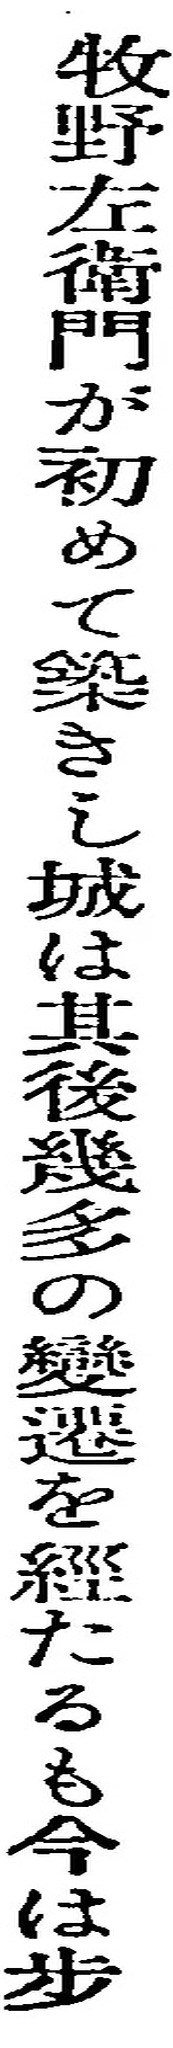牧野左衛門が初めて築きし城は其後幾多の變遷を經たるも今は歩
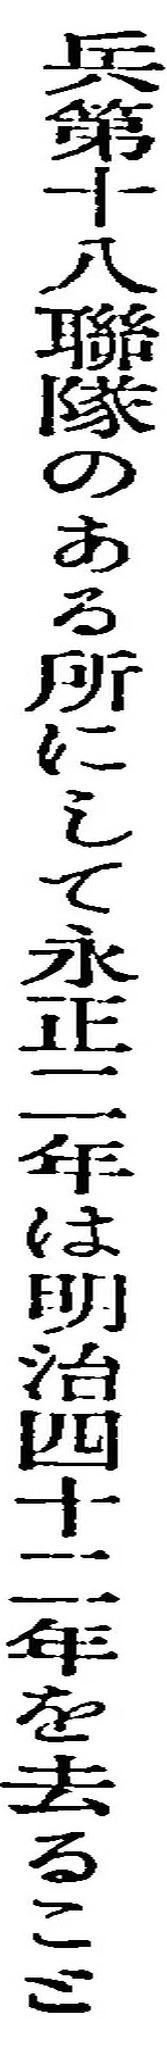兵十八聯隊のある所にして永正二年は明治四十二年を去ること
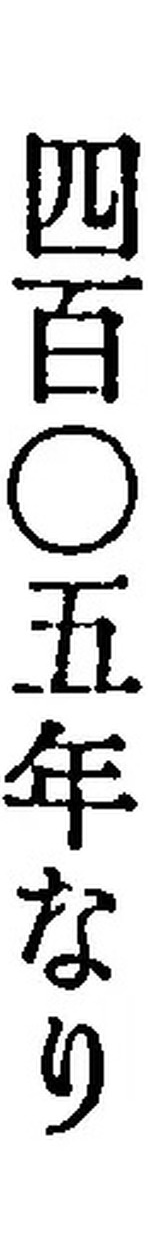四百〇五年なり
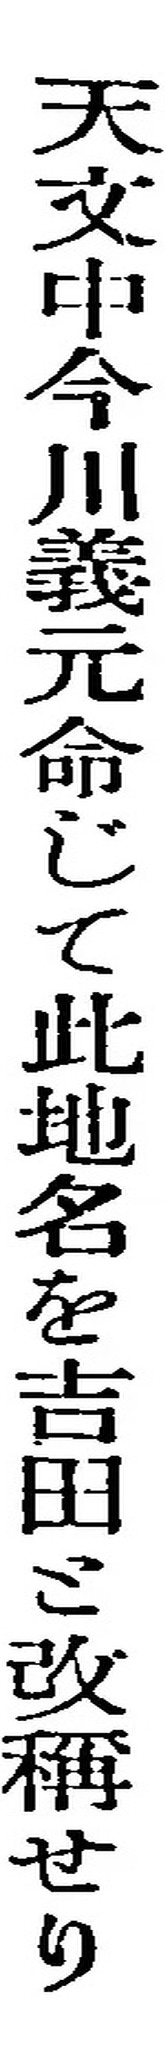天文中今川義元命じて此地名を吉田と改稱せり
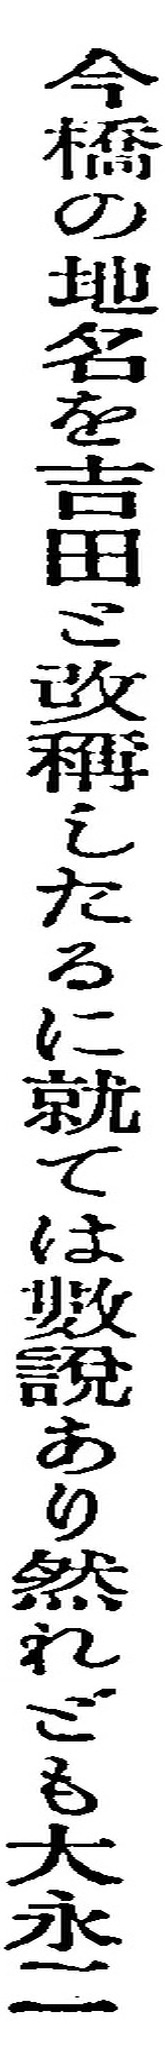今橋の地名を吉田と改稱したるに就ては數說あり然れども大永二
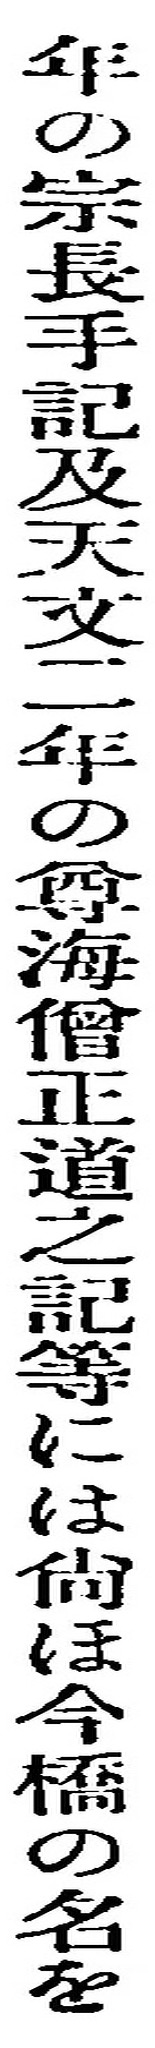年の宗長手記及天文二年の尊海僧正道之記等には尚ほ今橋の名を
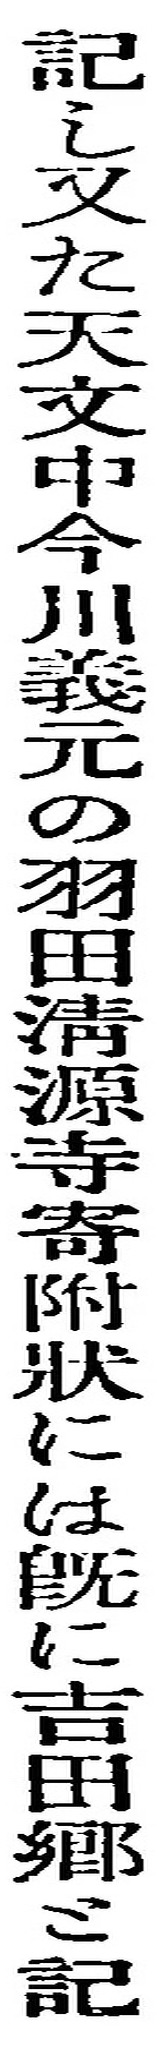記し又た天文中今川義元の羽田淸源寺寄附狀には既に吉田鄕と記
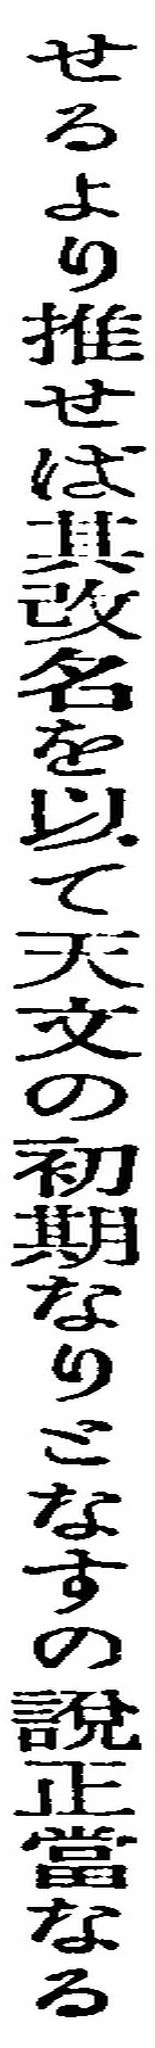せるより推せば其皆名を以て天文の初期なりとなすの說正當なる
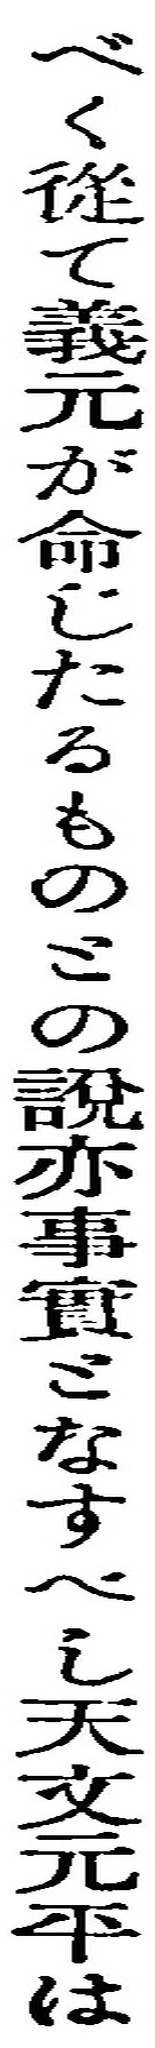べく從て義元が命じたるものとの說亦事實となすべし天文元平は
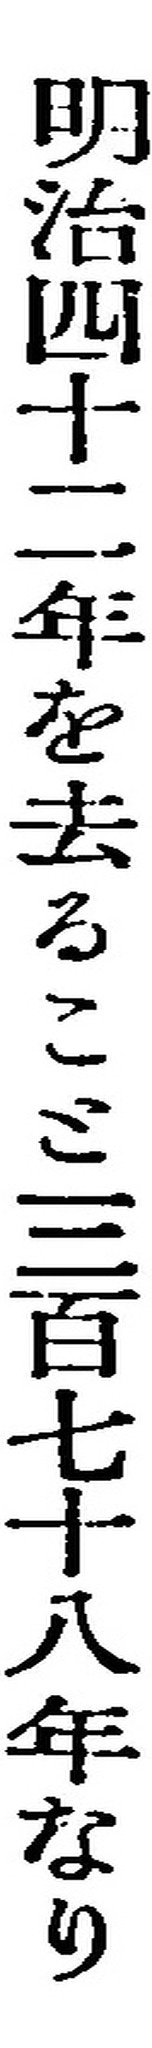明治四十二年を去ること三百七十八年なり
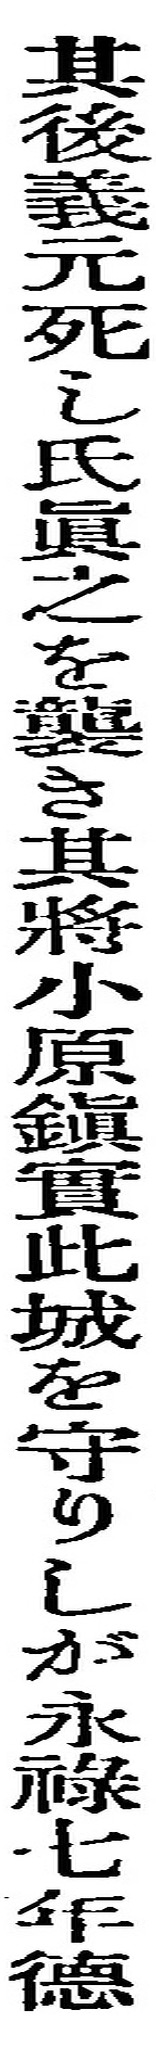其後義元死し氏眞之を襲き其將小原鎭實此城を守りしが永祿七年德
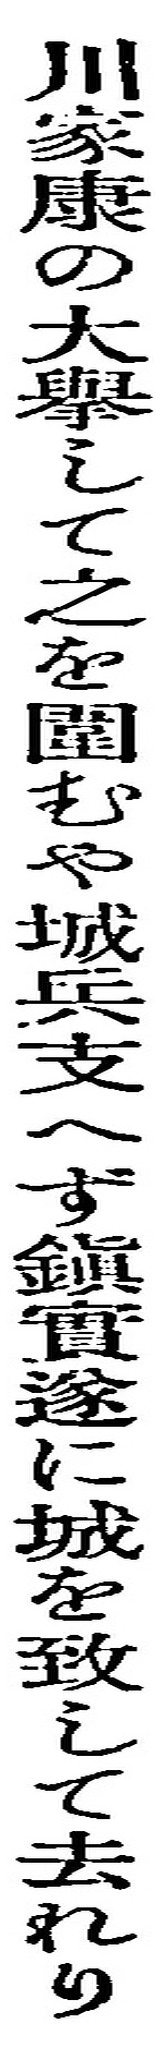川家康の大擧して之を圍むや城兵支へず鎭實遂に城を致して去れり
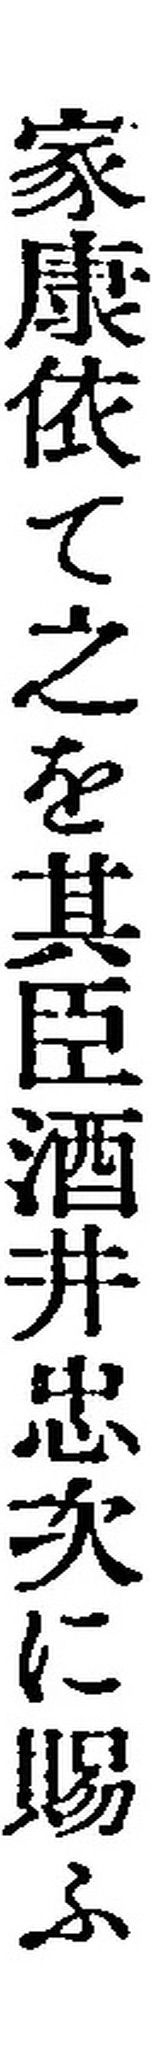家康依て之を其臣酒井忠次に賜ふ
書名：豊橋志要
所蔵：国立国会図書館 National Diet Library, JAPAN
